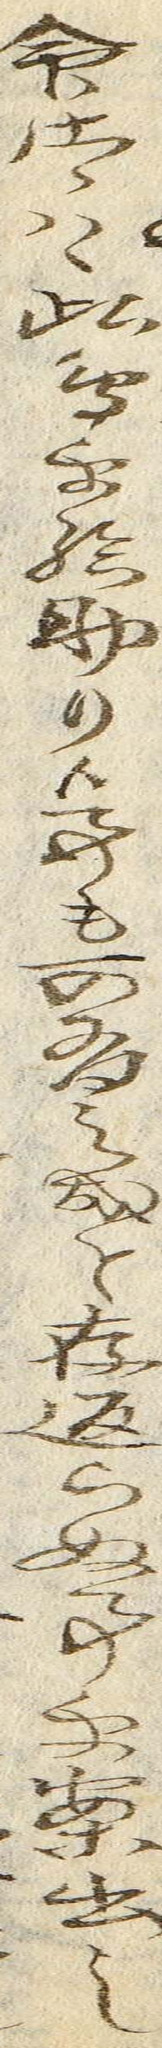命仕候ハヽ此鳥を給助り候事も可有之哉と存返らぬ事を案出し
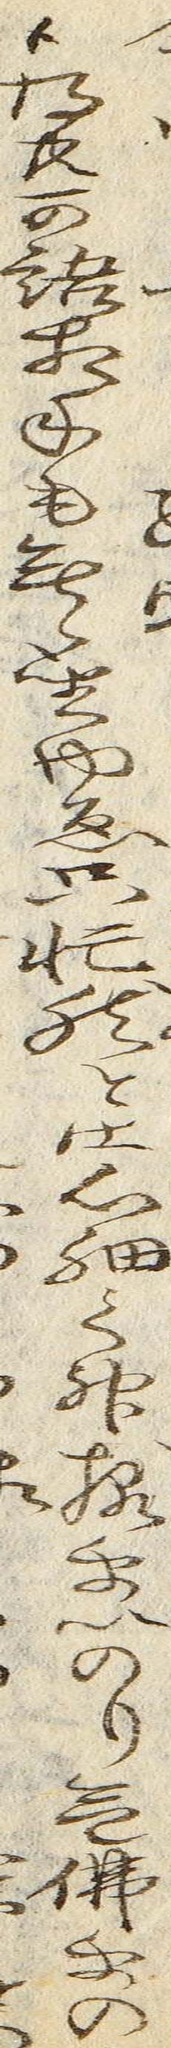候得共可語相手も無御座ゆゑ只忙然と仕心細く神様をいのり念仏をの
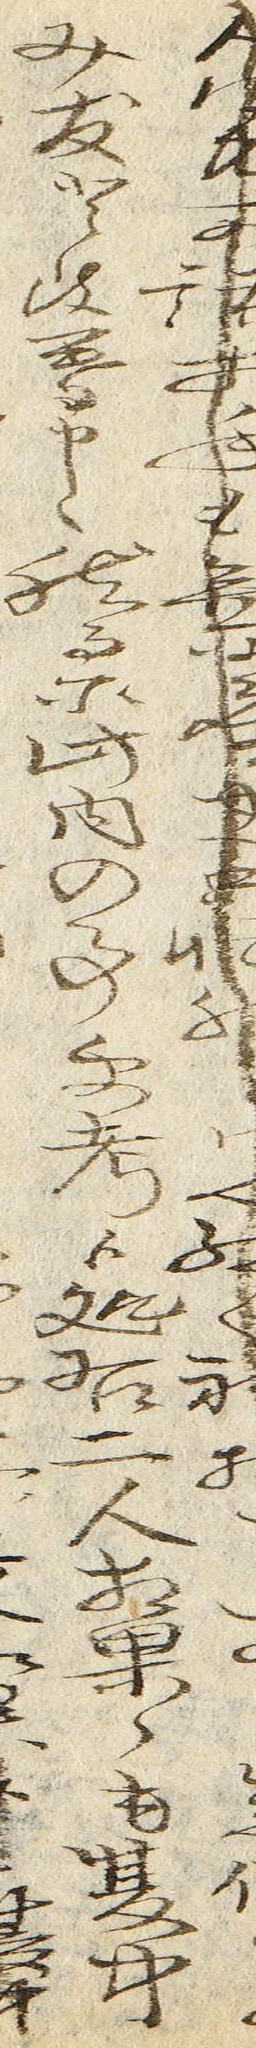み友と致暮申候然る所此内の事を考候処右二人相果候も夏中
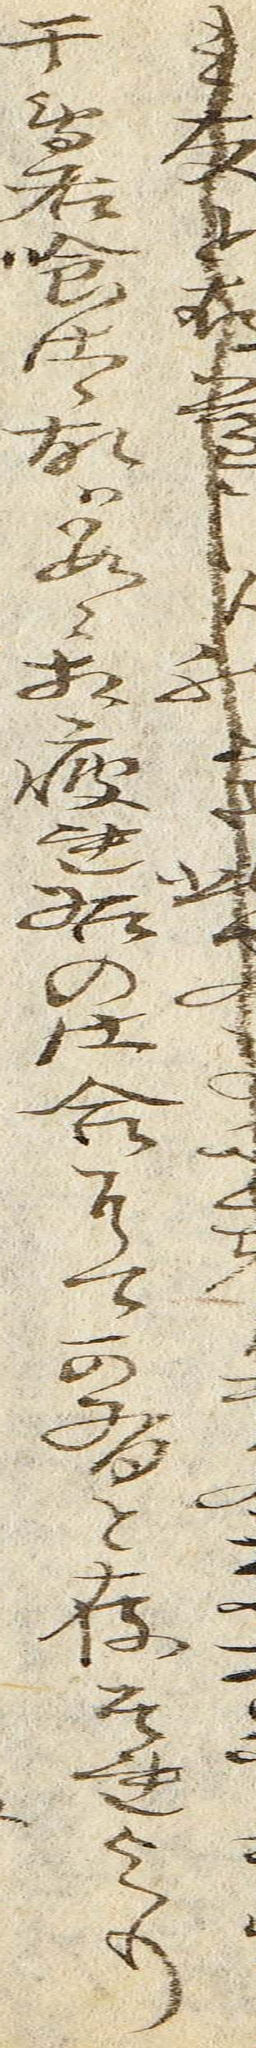干鳥居食仕候故か段々相疲れ右の仕合にて可有と存それより
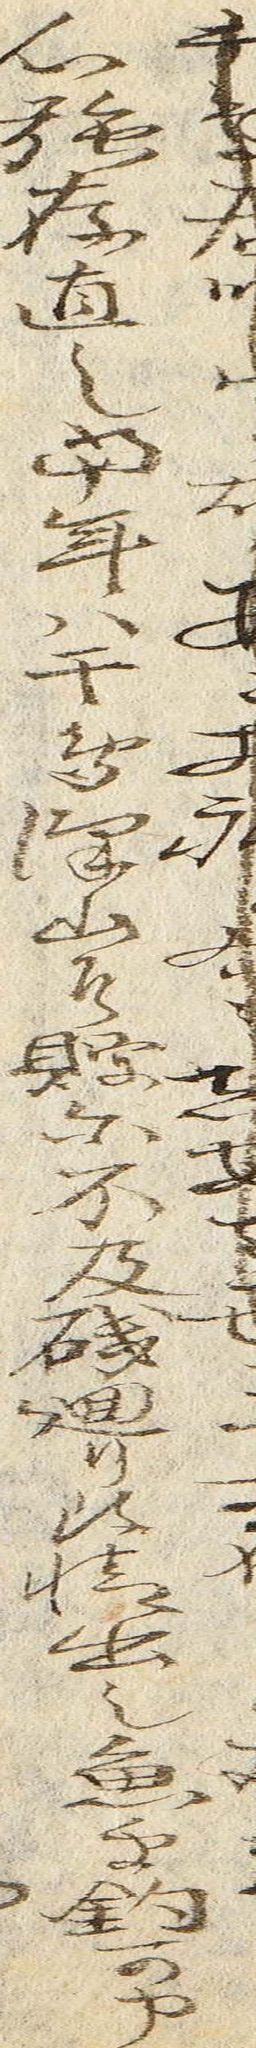心強存直し当年ハ干鳥沢山に貯に不及磯廻り致情出し魚を釣可申
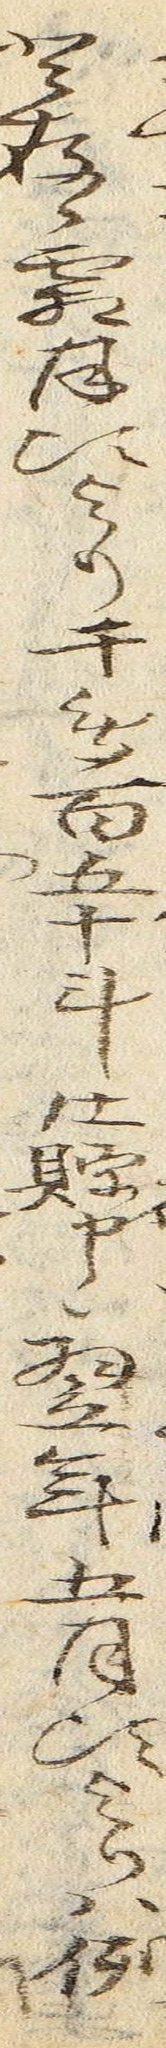と存候霜月頃より干鳥百五十計仕貯申候翌年五月頃よりハ例
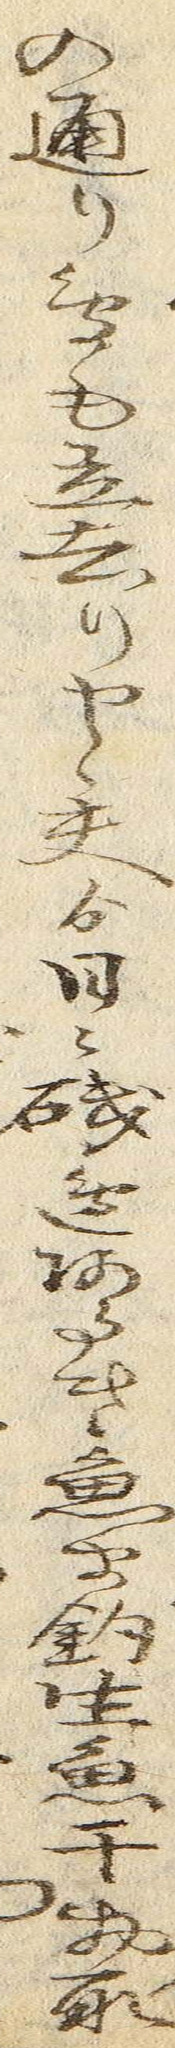の通り鳥も立去り申候夫ゟ日々磯辺あるき魚を釣生魚干物取
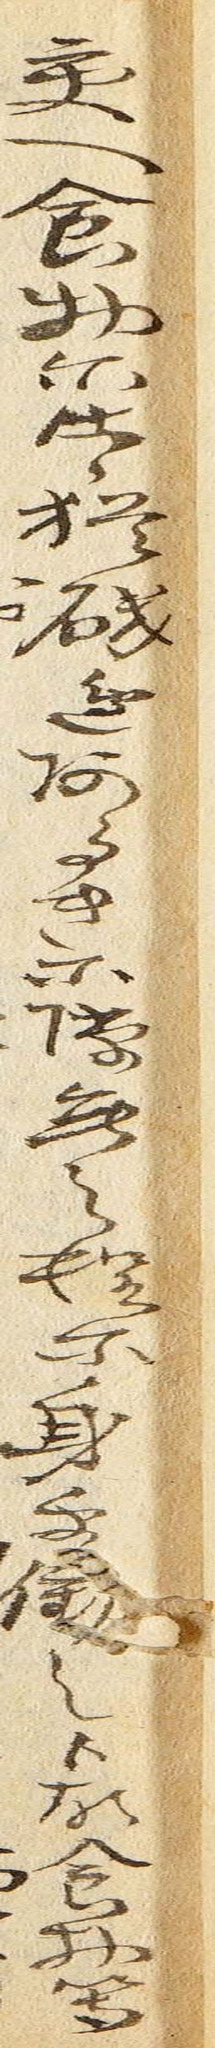交へ食物に仕候猶磯辺あるきに障無之程に身を働し候故食物等
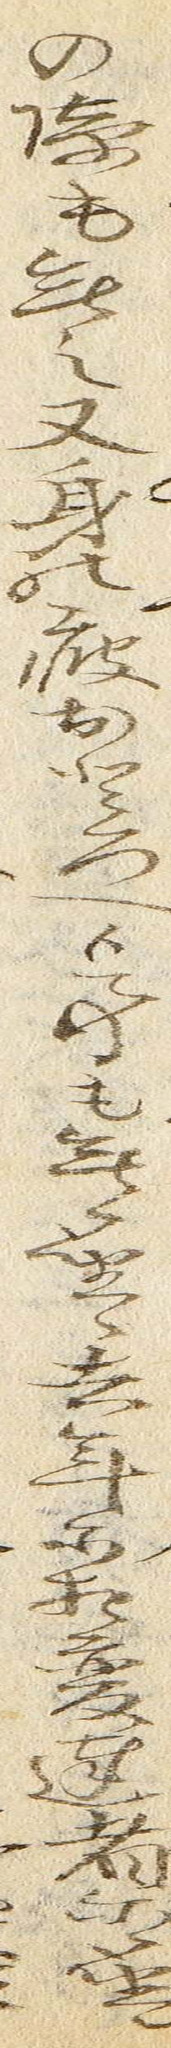の障も無之又身の疲おとろへ候事も無御座候去年に相変達者に御座候
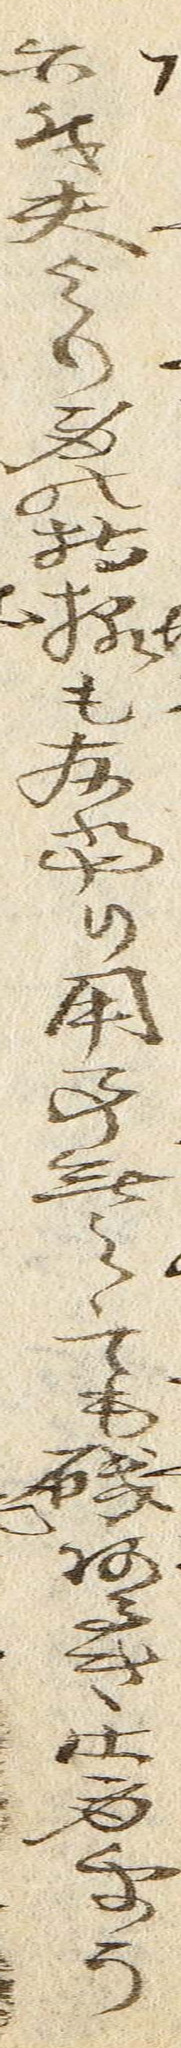に付夫より身の持様も存当り用事無之候ても磯あるき仕身をう
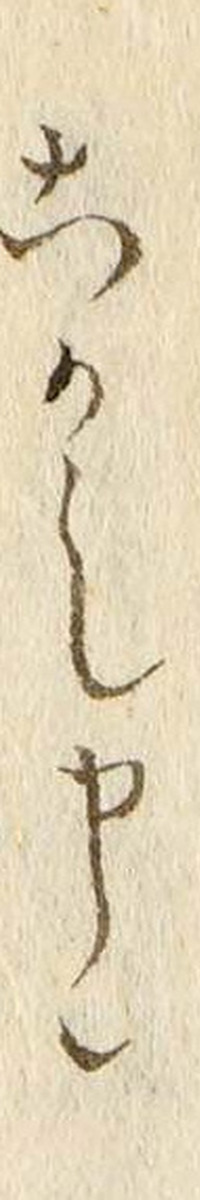こかし申候
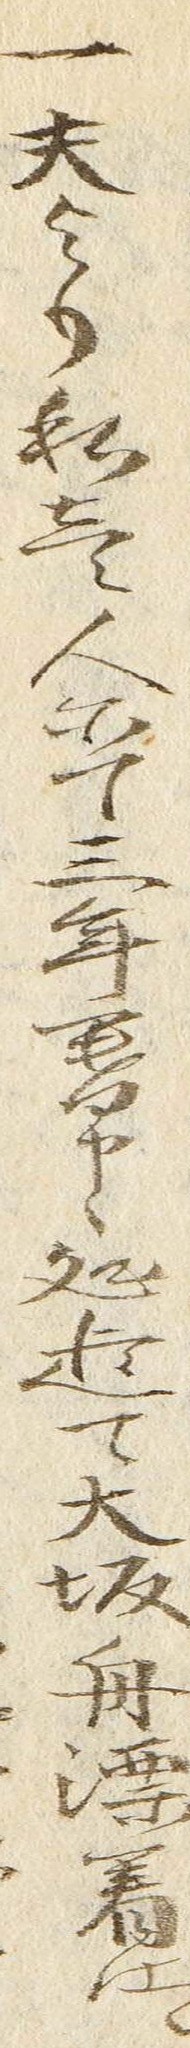一夫より私壱人にて三年暮申候処追て大坂舟漂着仕候
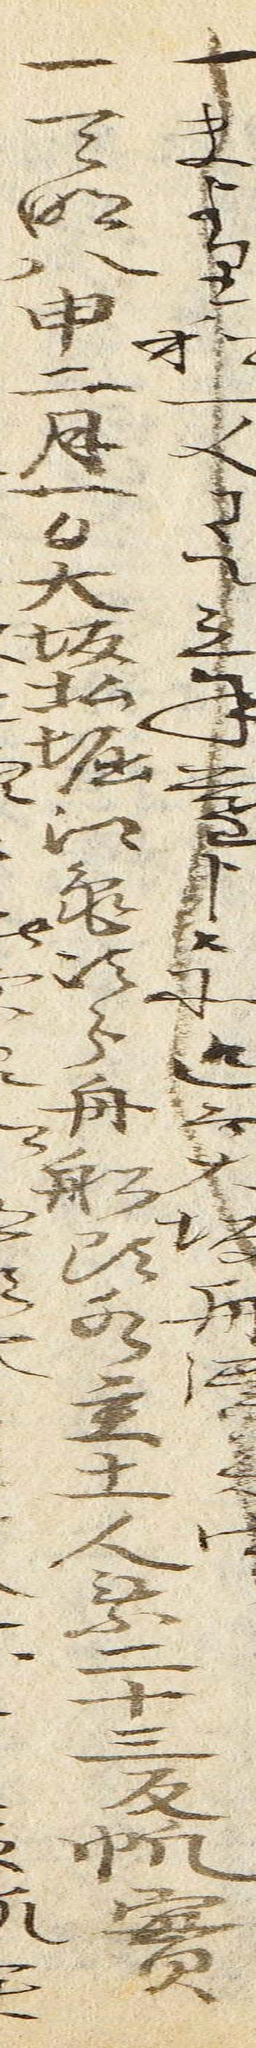一天明八申二月一日大坂北堀江亀次郎舟船頭水主十一人乗二十三反帆実
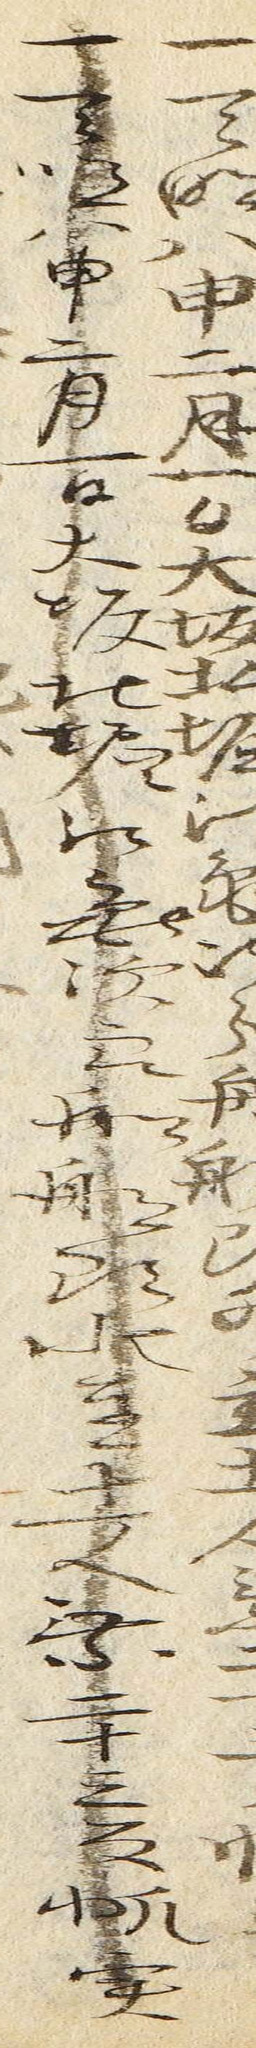一天明八申二月一日大坂北堀江亀次郎舟船頭水主十一人乗二十三反帆実
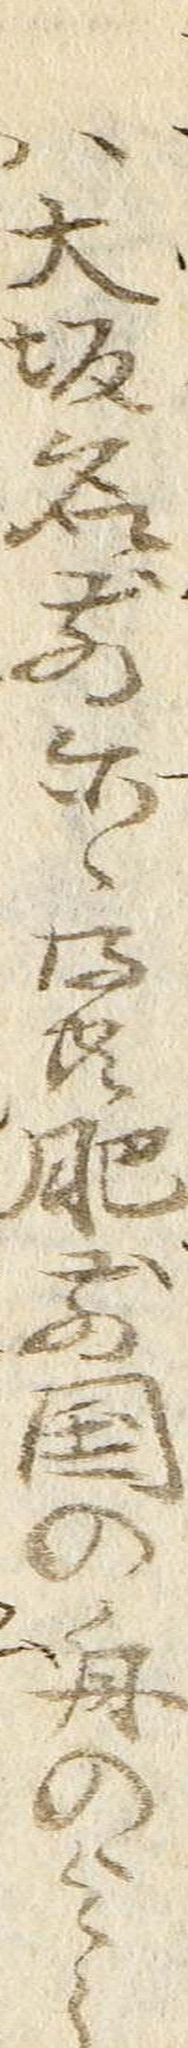ハ大坂名前に候得共肥前国の舟のよし
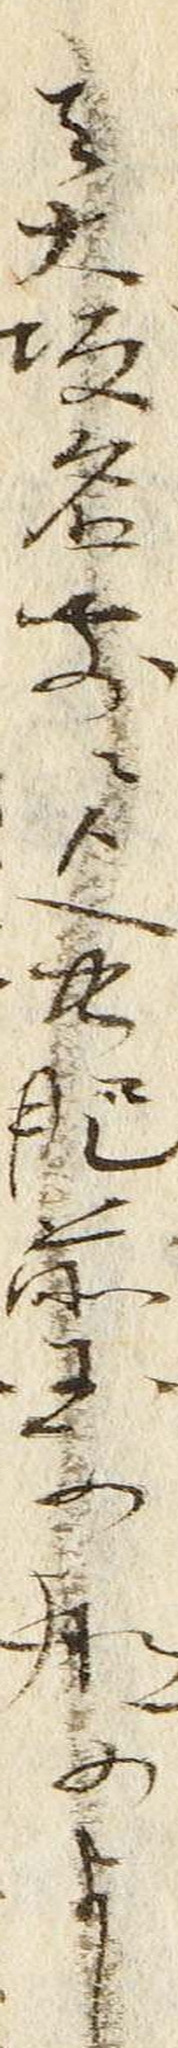ハ大坂名前に候得共肥前国の舟のよし
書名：無人島漂流書付
